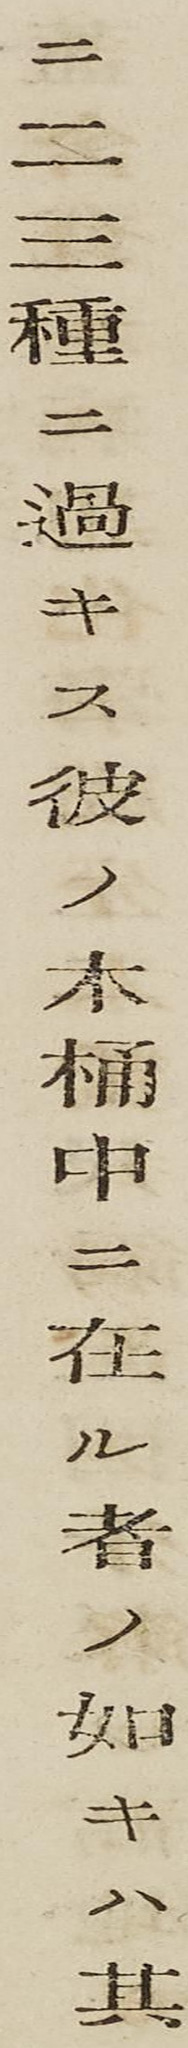ニ二三種ニ過キス彼ノ木槽中ニ在ル者ノ如キハ其
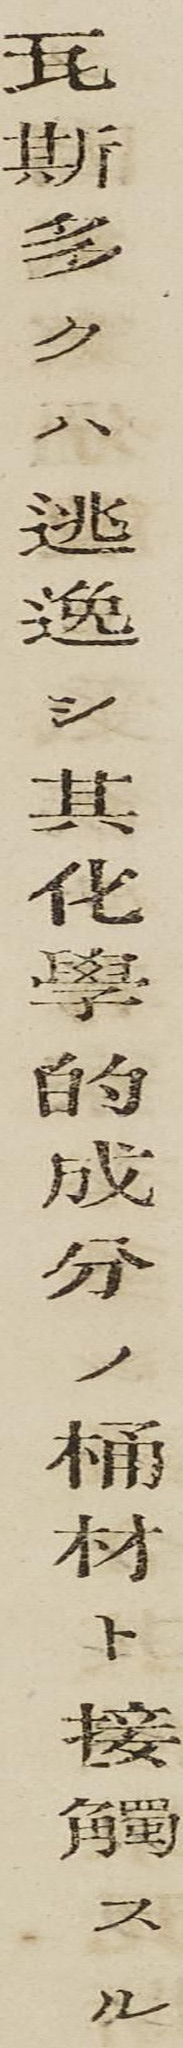瓦斯多クハ逃逸シ其化学的成分ノ槽材ト接触スル
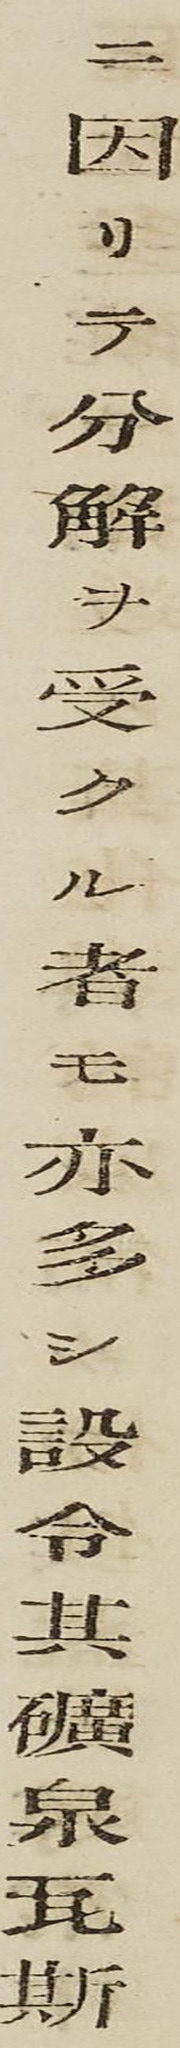ニ因リテ分解ヲ受クル者モ亦多シ設令其礦泉瓦斯
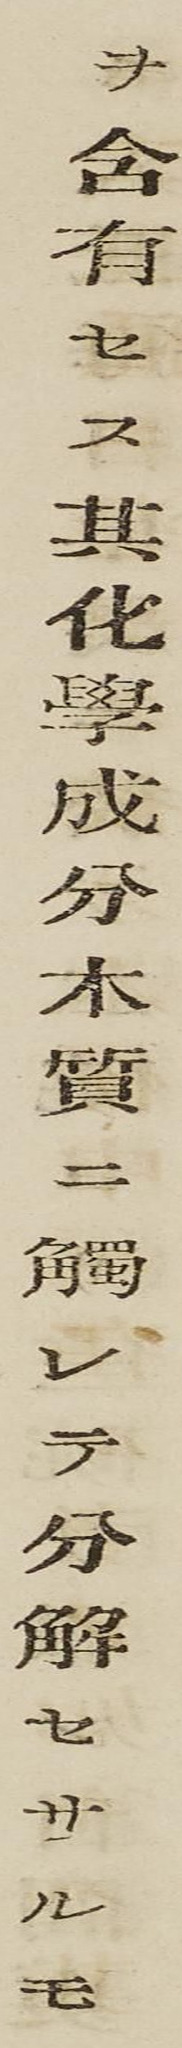ヲ含有セス其化学成分木質ニ触レテ分解セサルモ
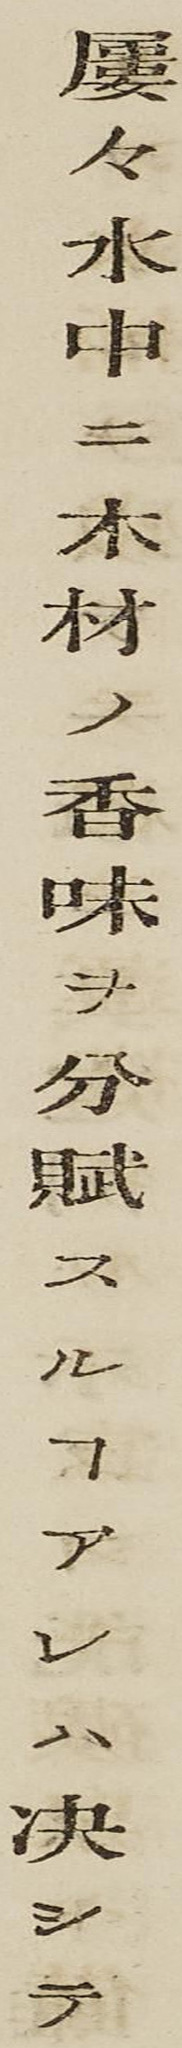屡々水中ニ木材ノ香味ヲ分賦スルコトアレハ決シテ
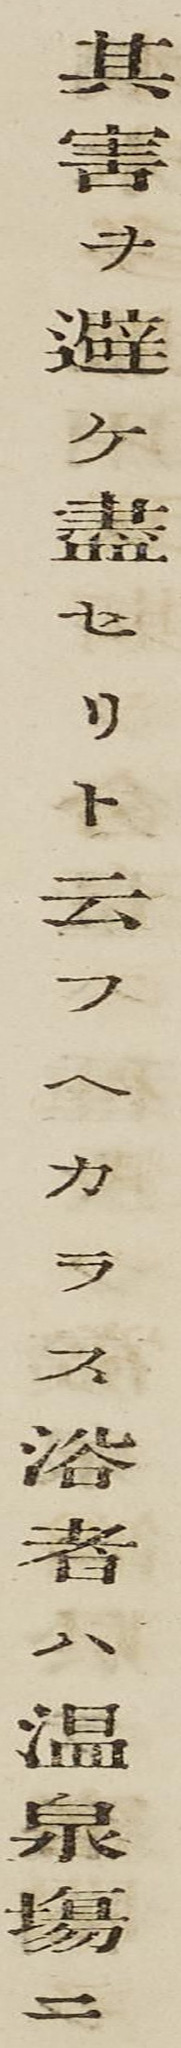其害ヲ避ケ尽セリト云フヘカラス浴者ハ温泉場ニ
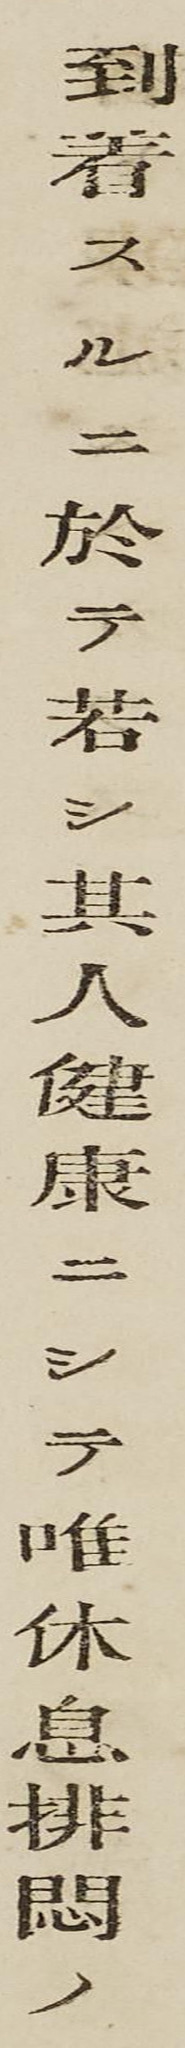到着スルニ於テ若シ其人健康ニシテ唯休息排悶ノ
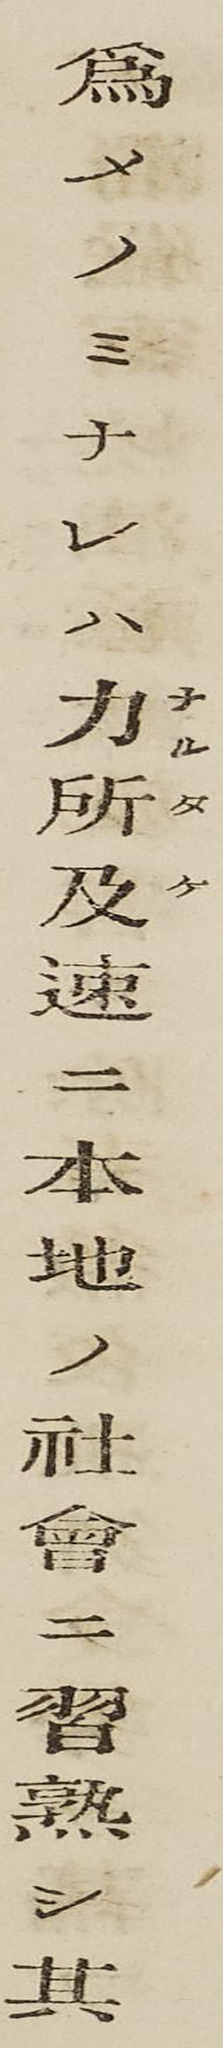為メノミナレハ力所及速ニ本地ノ社会ニ習熟シ其
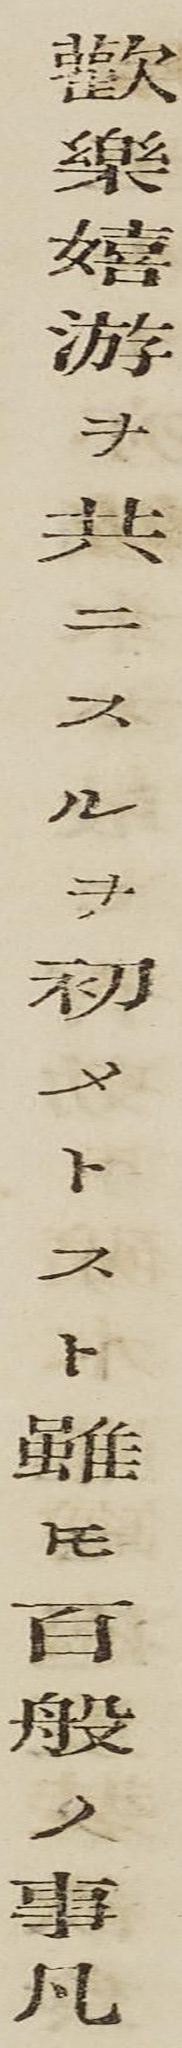歓楽嬉游ヲ共ニスルヲ初メトスト雖トモ百般ノ事凡
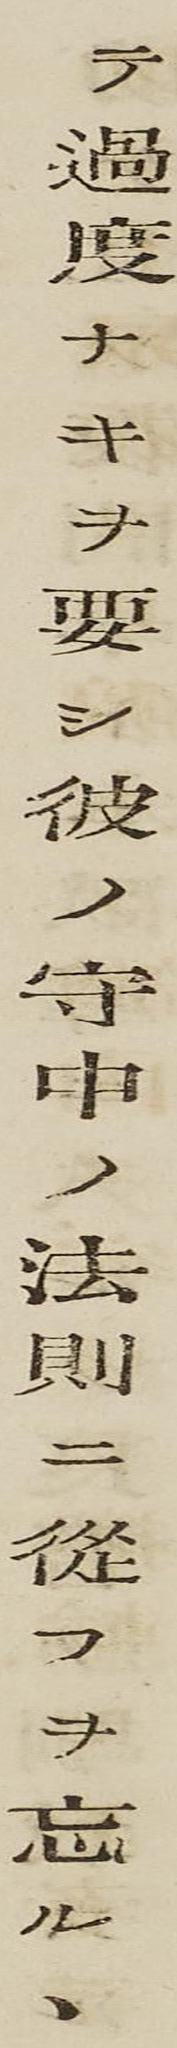テ過度ナキヲ要シ彼ノ守中ノ法則ニ従フヲ忘ルヽ
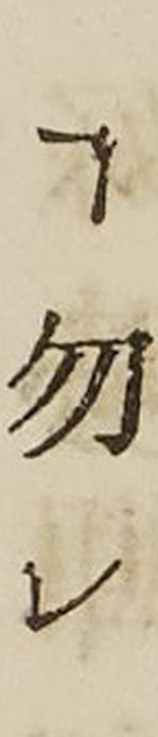コト勿レ
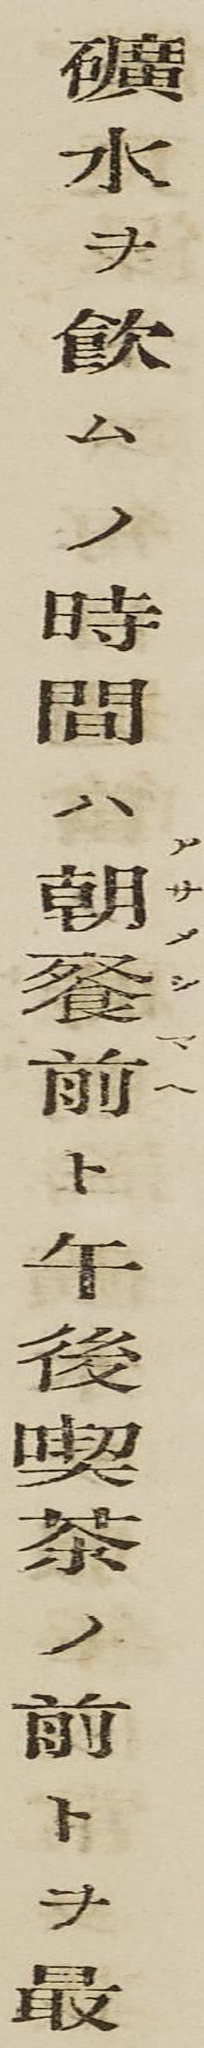礦水ヲ飲ムノ時間ハ朝餐前ト午後喫茶ノ前トヲ最

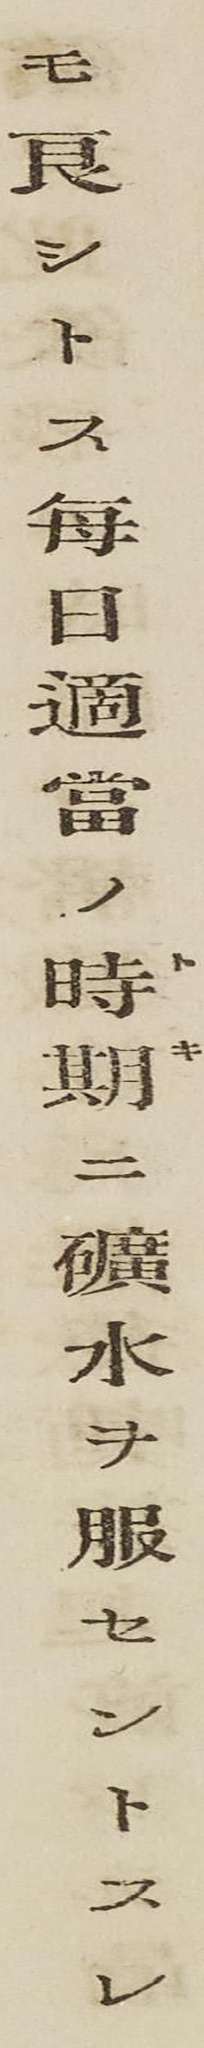モ良シトス毎日適当ノ時期ニ礦水ヲ服セントスレ
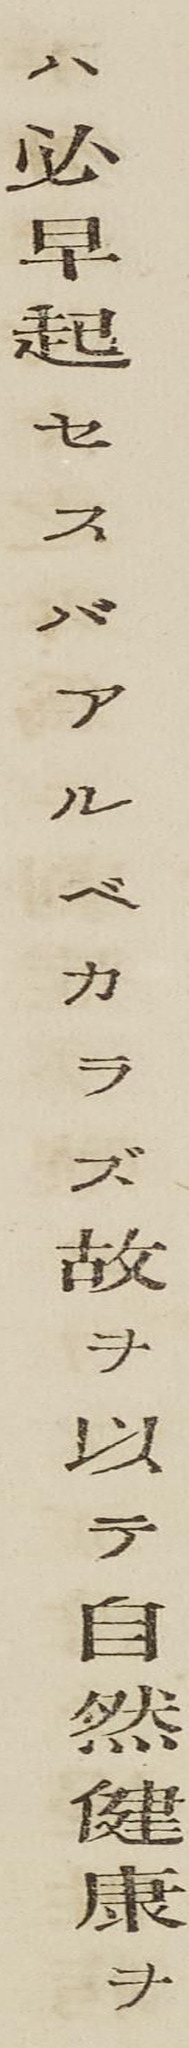ハ必早起セスバアルベカラス故ヲ以テ自然健康ヲ
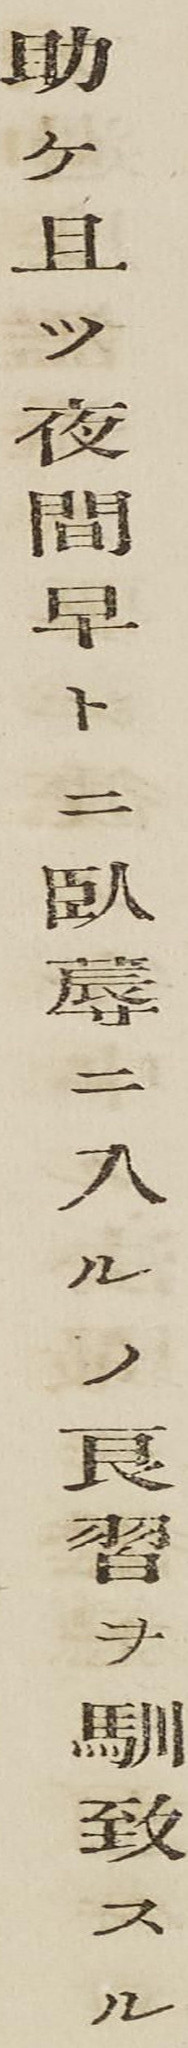助ケ且ツ夜間早トニ臥蓐ニ入ルノ良習ヲ馴致スル
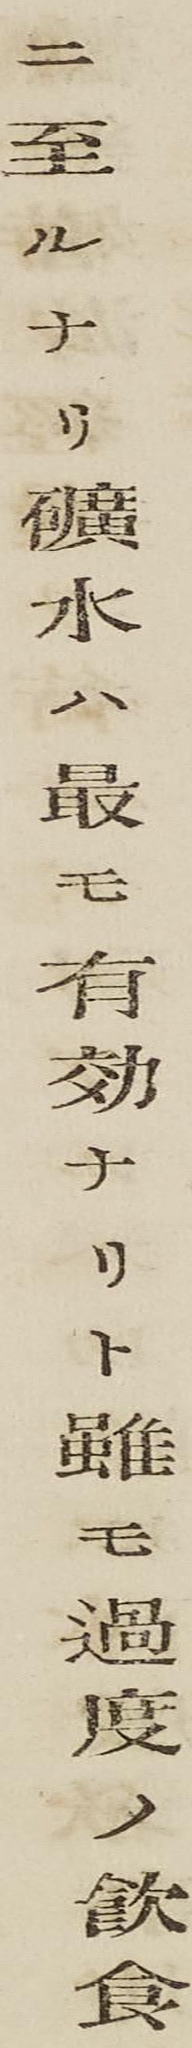ニ至ルナリ礦水ハ最モ有効ナリト雖モ過度ノ飲食
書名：日本温泉考
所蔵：東京大学地震研究所図書室 Earthquake Research Institute Library, The University of Tokyo, JAPAN
